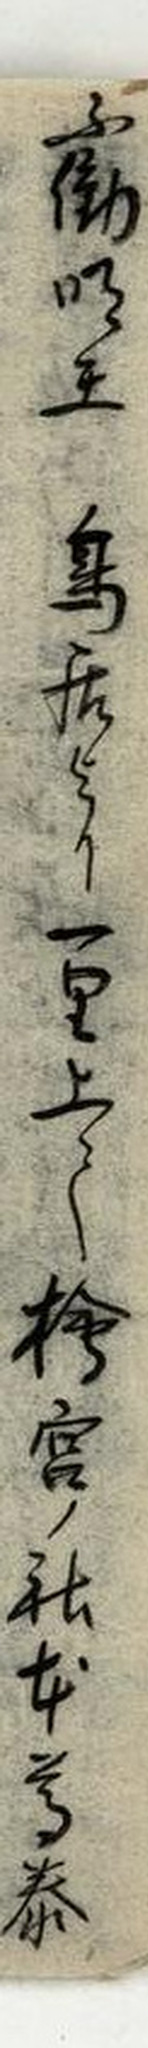不動明王鳥居与り一里上之檜宮ノ本尊泰
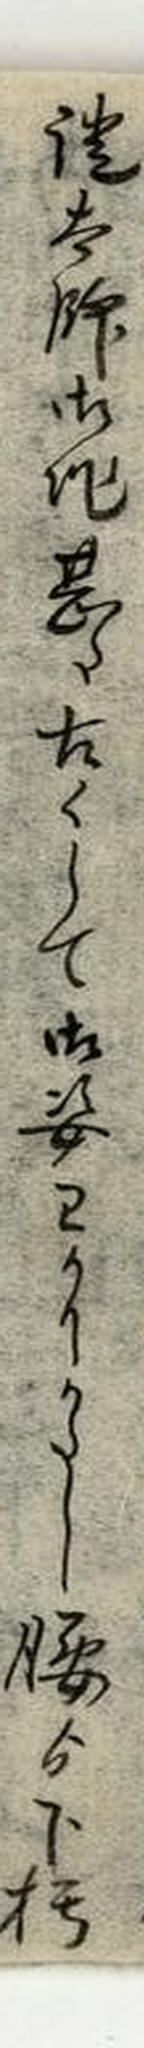證大師御作甚多た古くして御姿わけだし腰ゟ下朽
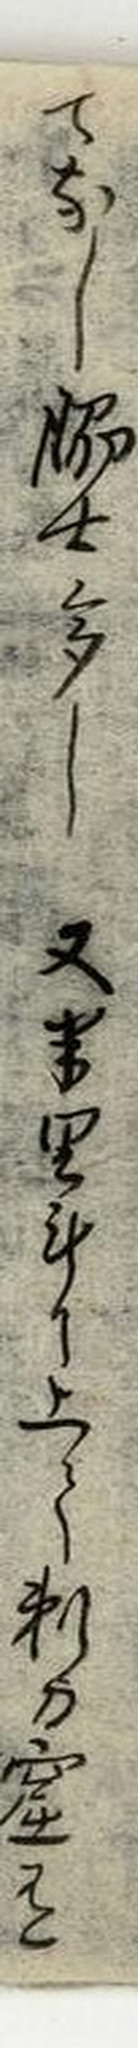て奈し脇士多し又半里斗り上之刺刀窟有
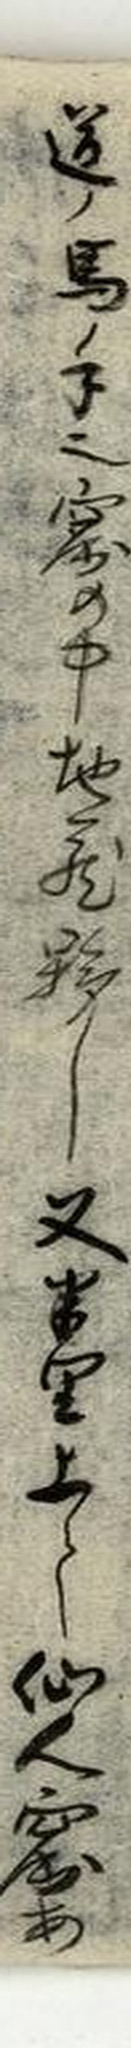道ノ馬手ニ窟の中地蔵夥し又半里上に仙人窟あ
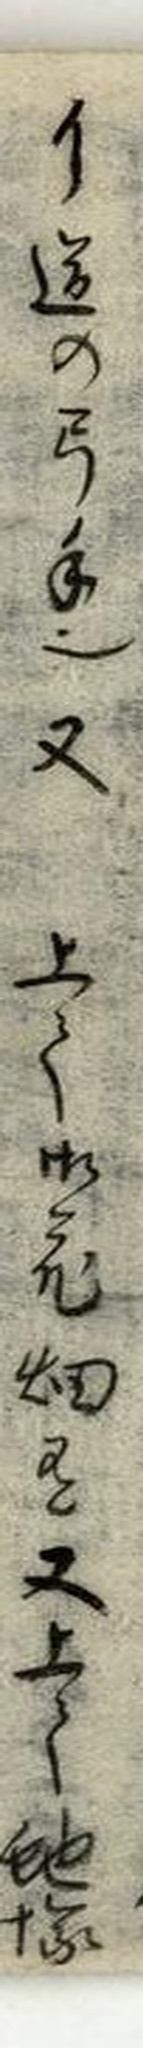り道の弓手也又上に御花畑有又上に塚
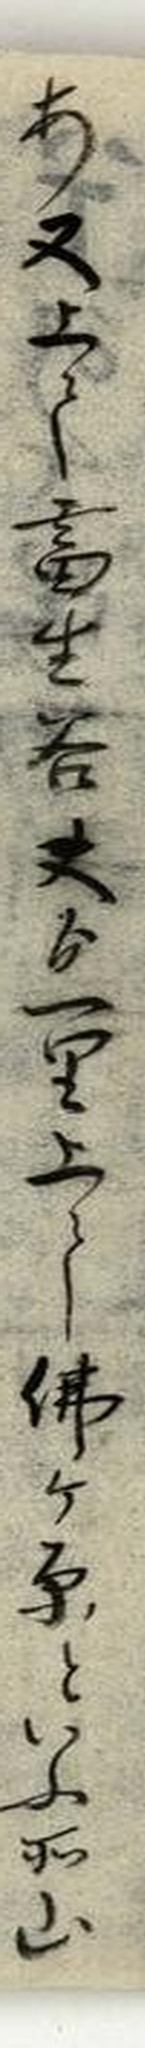あ又上に畜生谷夫ゟ一里上に仏ケ原といふ所山
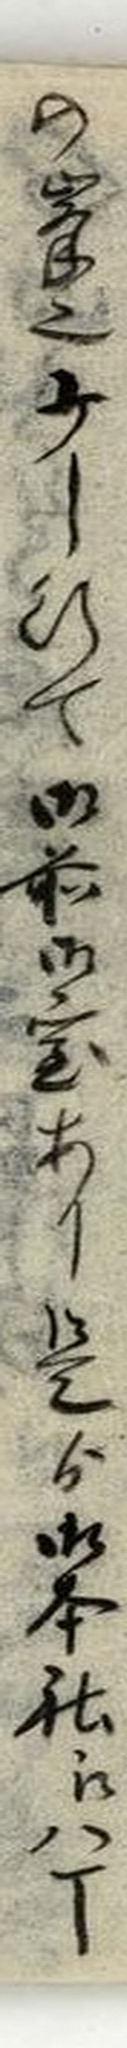の峰也少し行て御前御室あり是ゟ御本江八丁
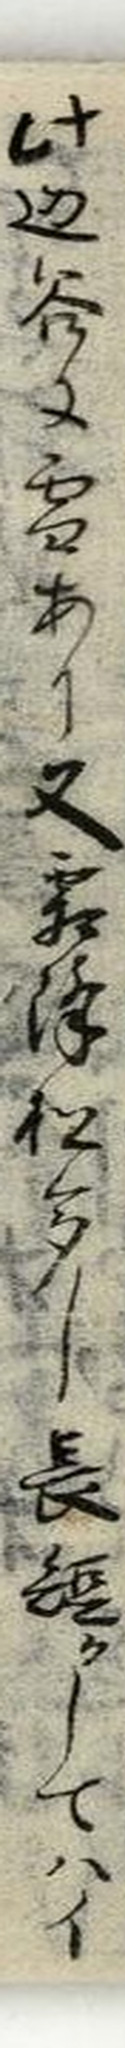此辺谷又雪あり又霜降松多し長短クしてハイ
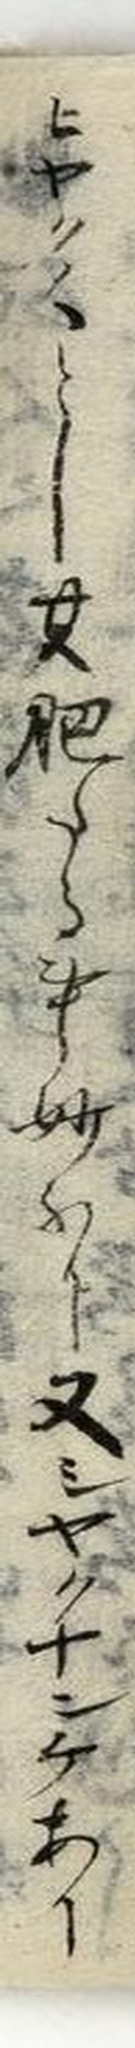ヒヤクとし其肥えたる中妙なり又シャクナンケあり
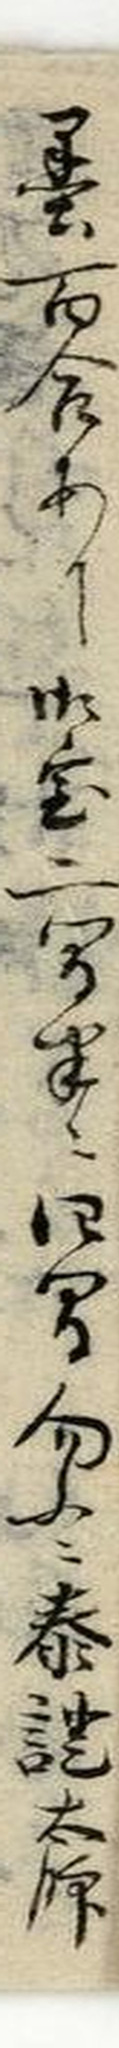墨百合ありお室二間半に四間向ふに泰澄大師
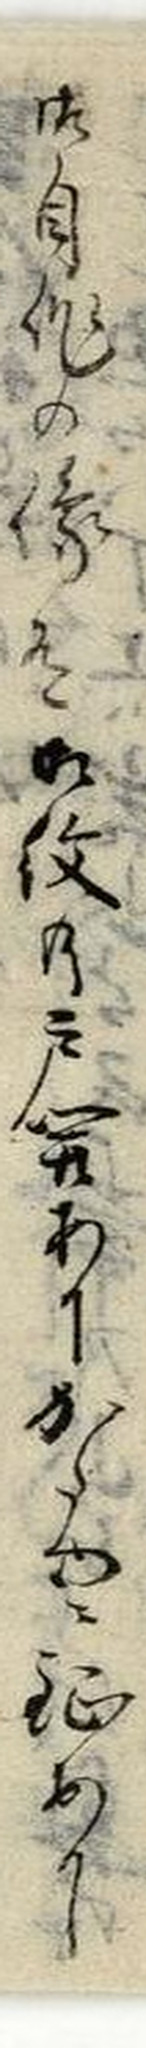御自作の像有御紋乃戸開ありかたニ鉦あり
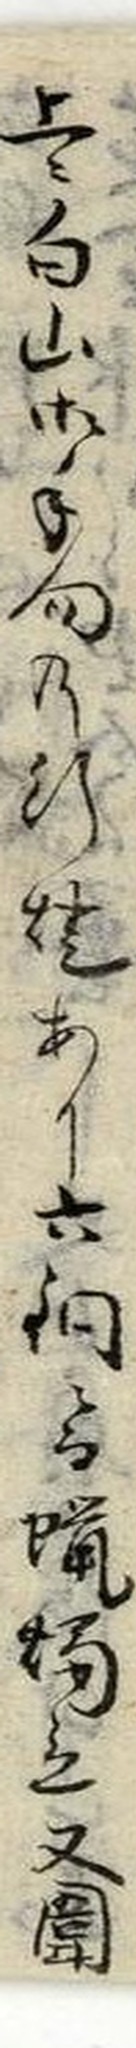上ニ白山御手向乃行燈あり六銅二而蠟燭立又囲
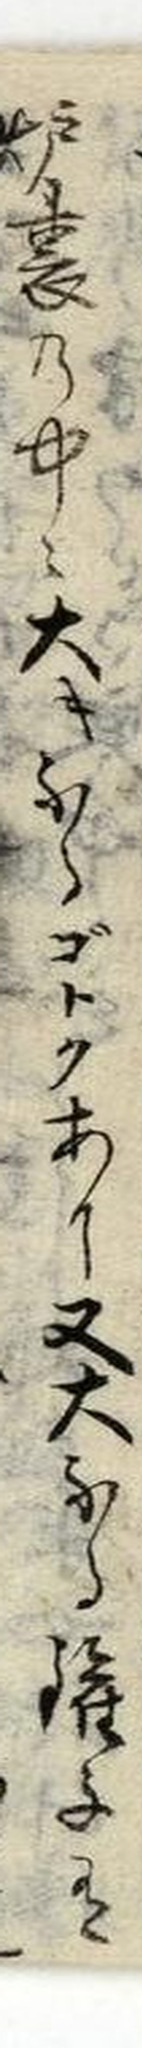炉裏乃中ニ大きなるゴトクあり又大なる子有
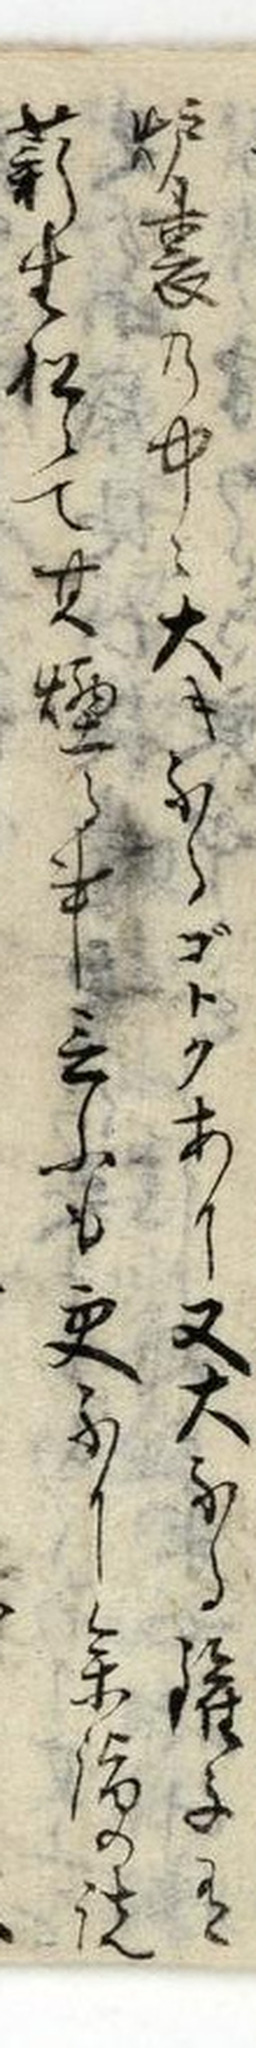薪生松ニて其煙る〃中云ふも更なり参詣の洗
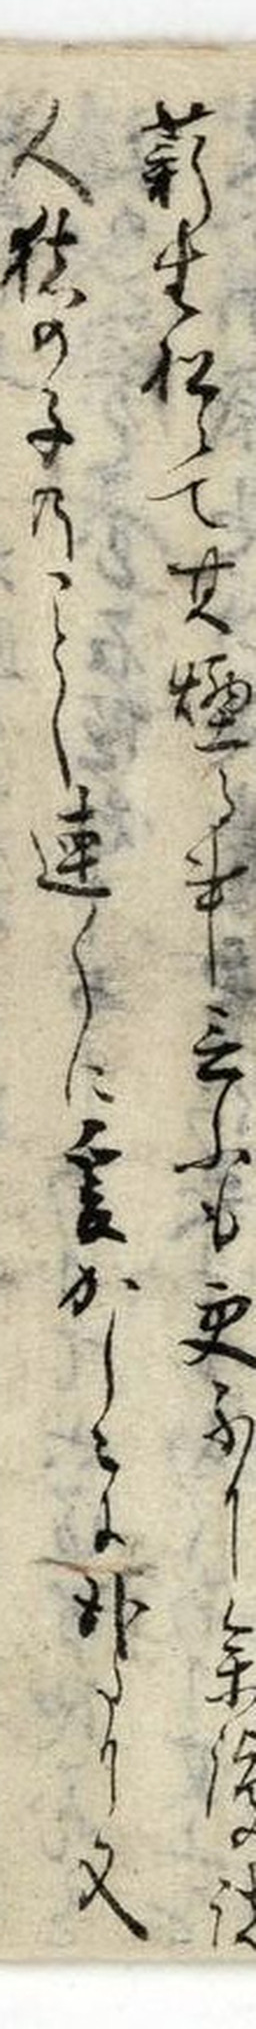人猪の子乃ことし連にかしこにたり又
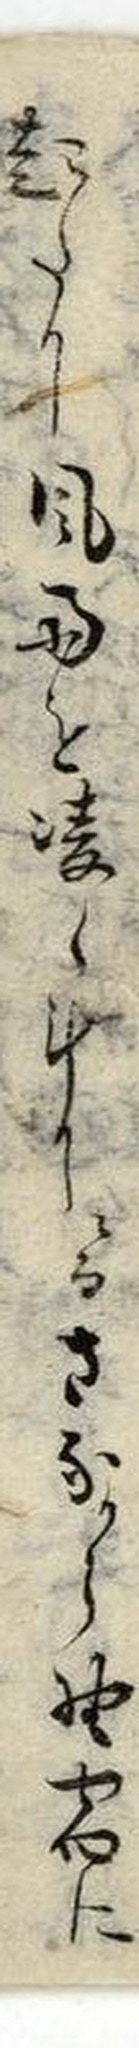起たり風雨を凌ぐ斗りニ而さながら野宿に
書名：白山道中名所筆記（旅日記）
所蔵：福井県文書館 Fukui Prefectural Archives
